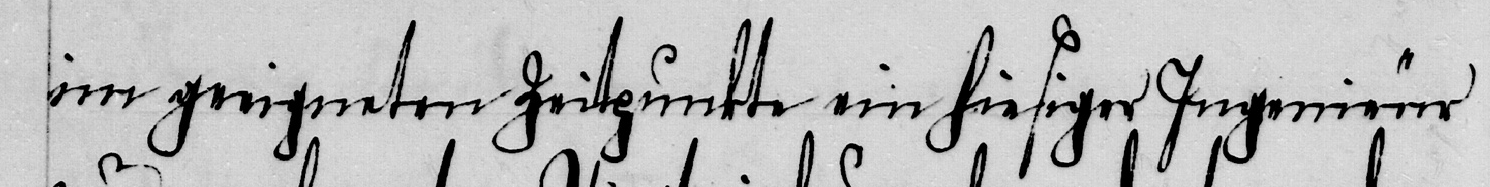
im geeigneten Zeitpunkte ein hiesiger Ingenieur
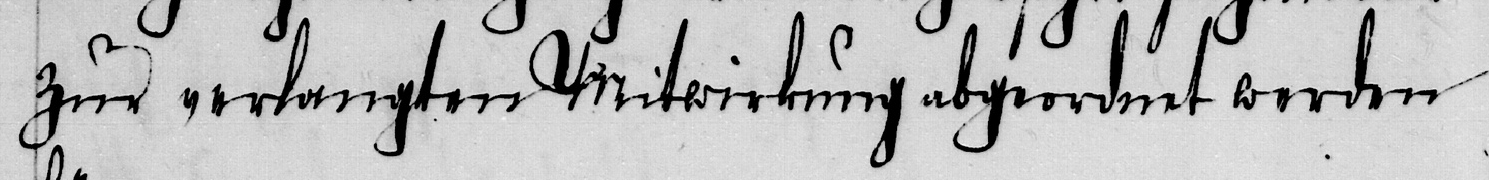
zur verlangten Mitwirkung abgeordnet werden
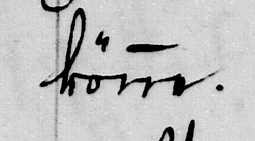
könne.
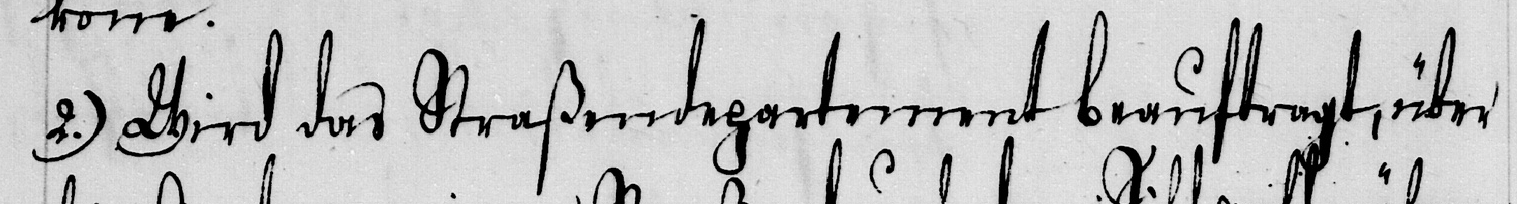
2.) Wird das Straßendepartement beauftragt, über
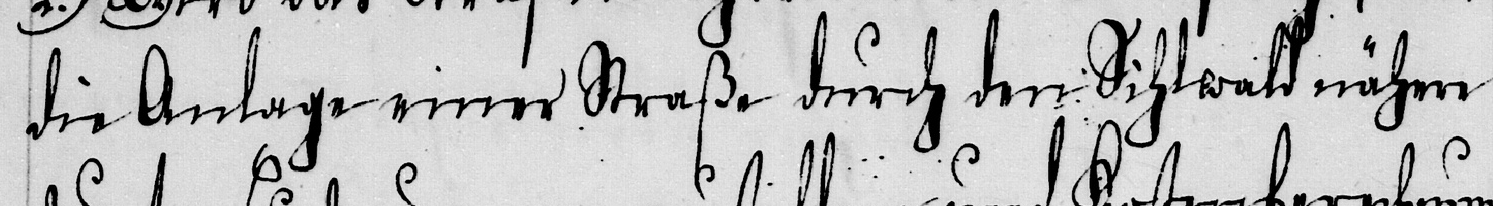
die Anlage einer Straße durch den Sihlwald nähere
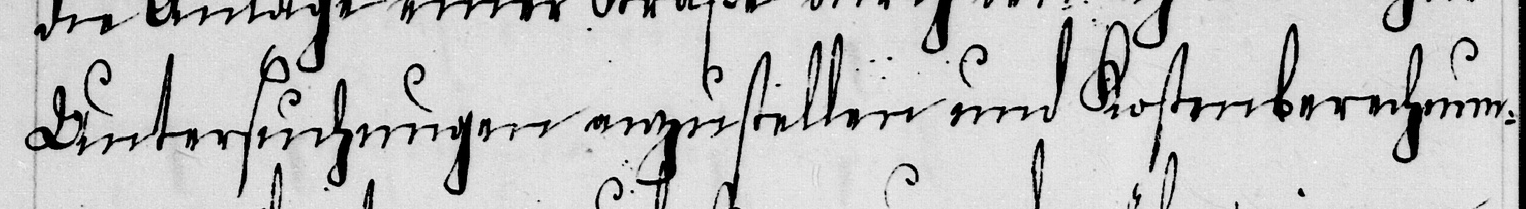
Untersuchungen anzustellen und Kostenberechnun¬
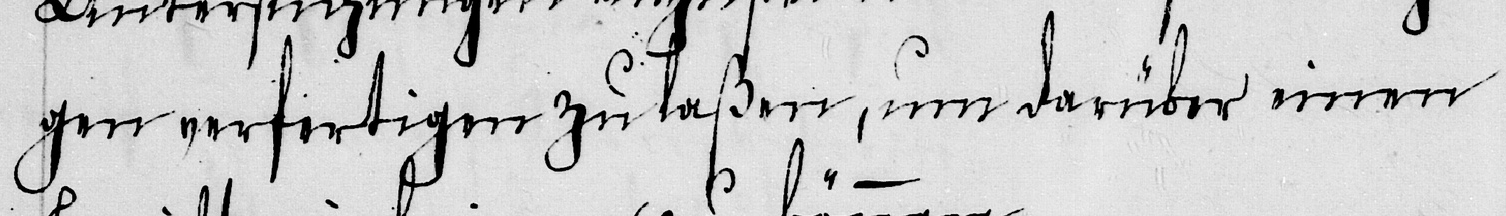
gen verfertigen zu laßen, um darüber einen
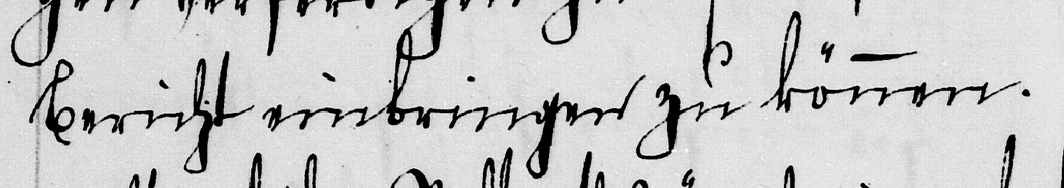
Bericht einbringen zu können.
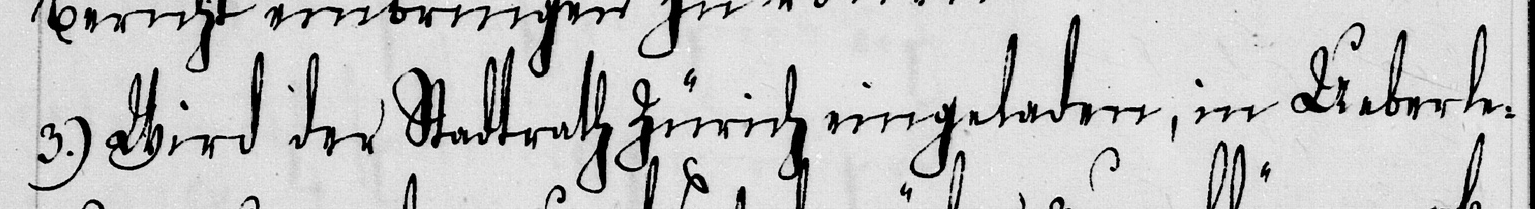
3.) Wird der Stadtrath Zürich eingeladen, in Ueberle¬
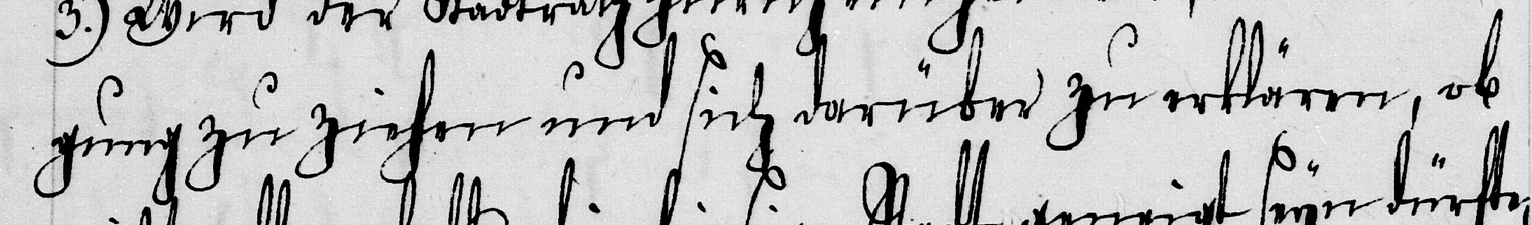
gung zu ziehen und sich darüber zu erklären, ob
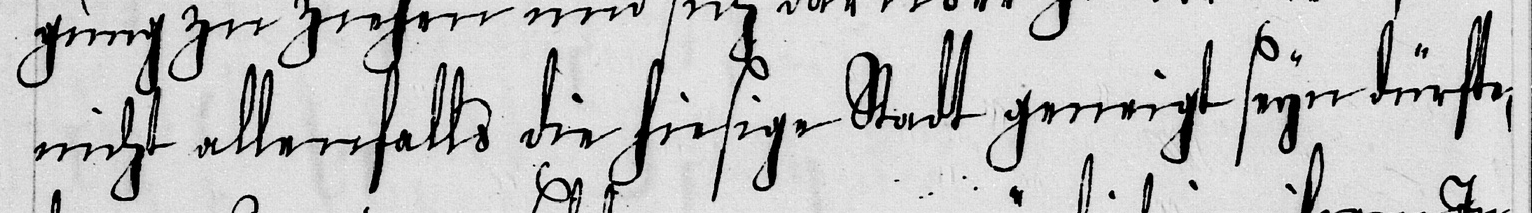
nicht allenfalls die hiesige Stadt geneigt seyn dürfte,
